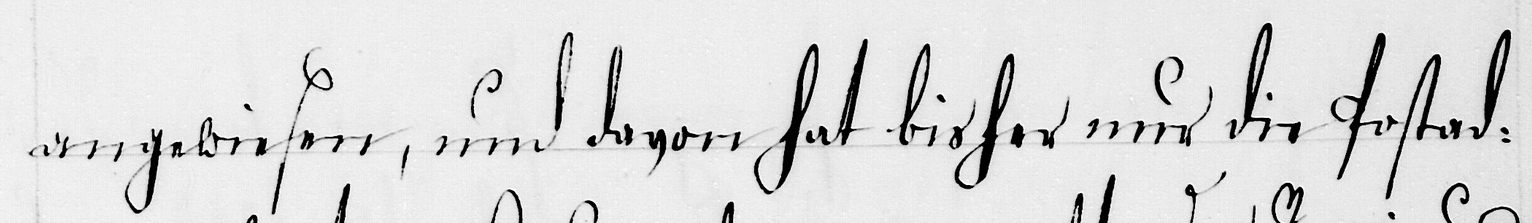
angewiesen, und davon hat bisher nur die Postad¬
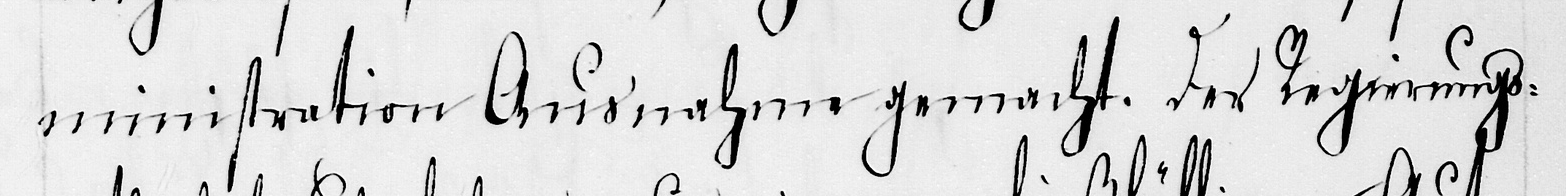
ministration Ausnahme gemacht. Der Regierungs¬
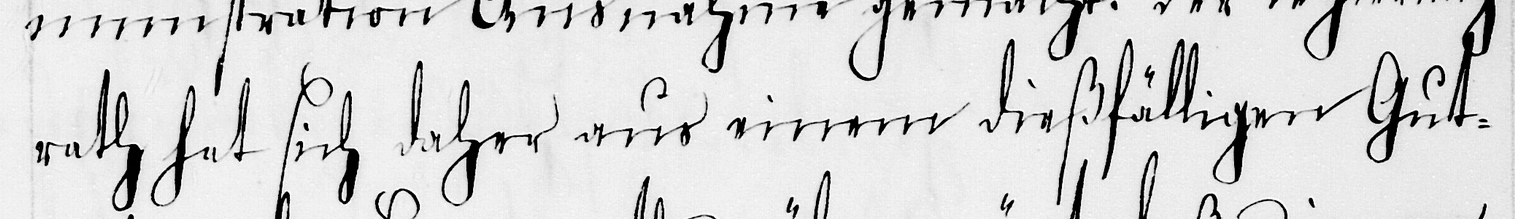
rath hat sich daher aus einem dießfälligen Gut¬
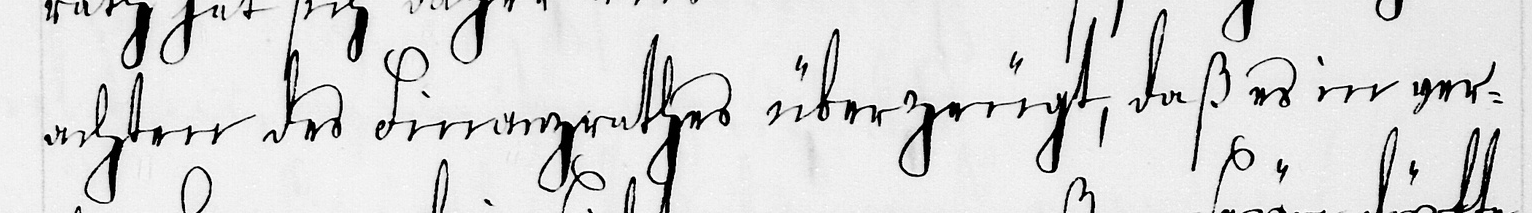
achten des Finanzrathes überzeugt, daß es in ver¬
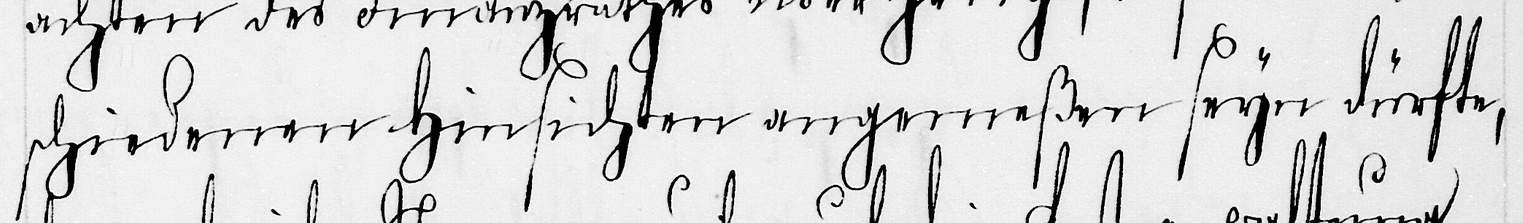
schiedenen Hinsichten angemeßen seyn dürfte,
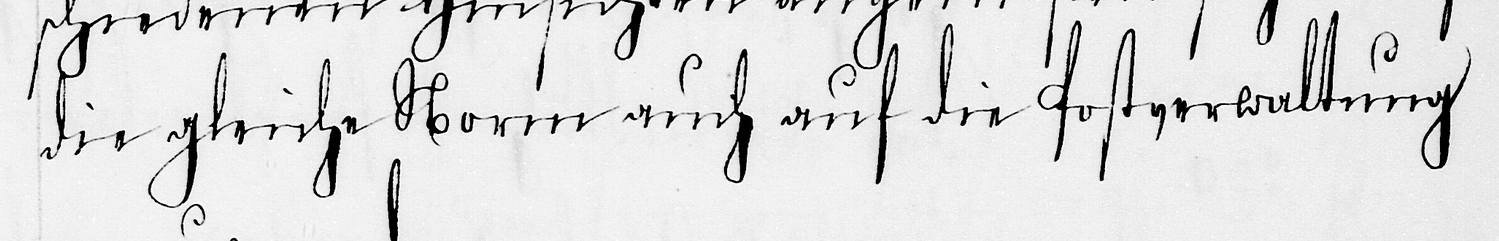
die gleiche Norm auch auf die Postverwaltung
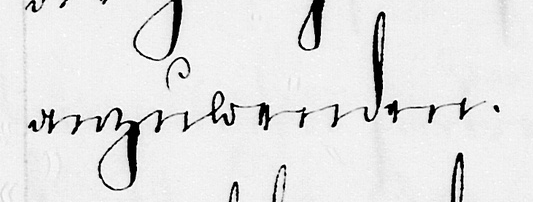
anzuwenden.
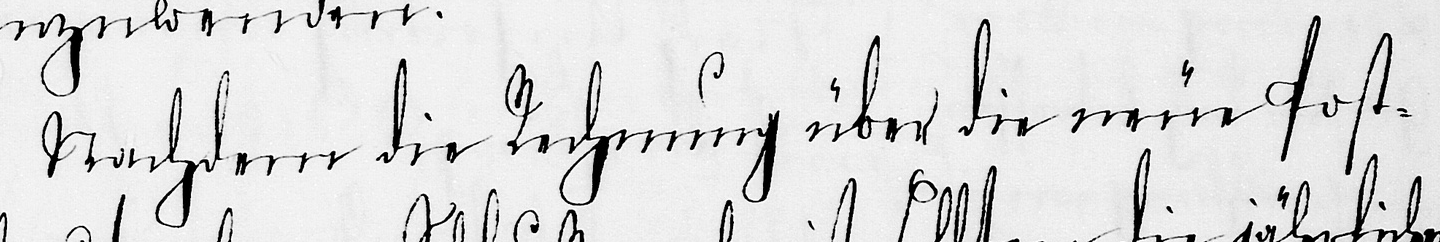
Nachdem die Rechnung über die neue Post¬
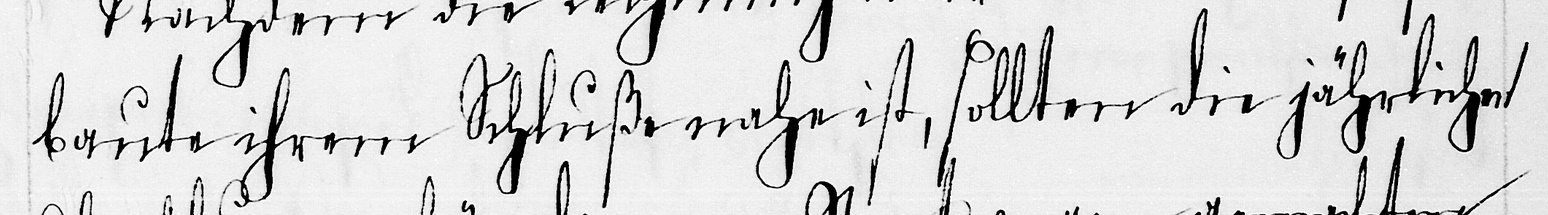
baute ihrem Schluße nahe ist, sollten die jährlichen
